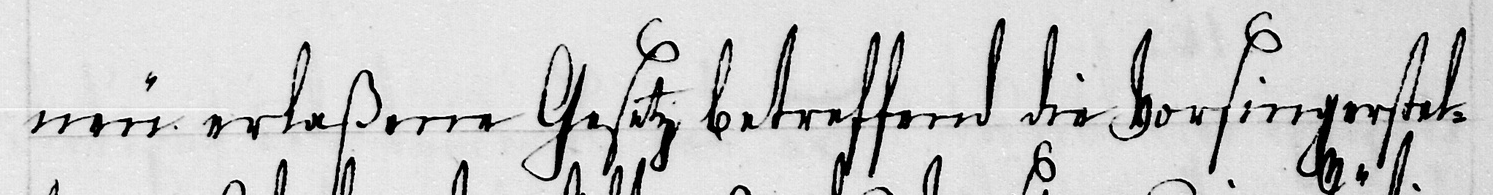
neu erlaßene Gesetz betreffend die Vorsingerste¬
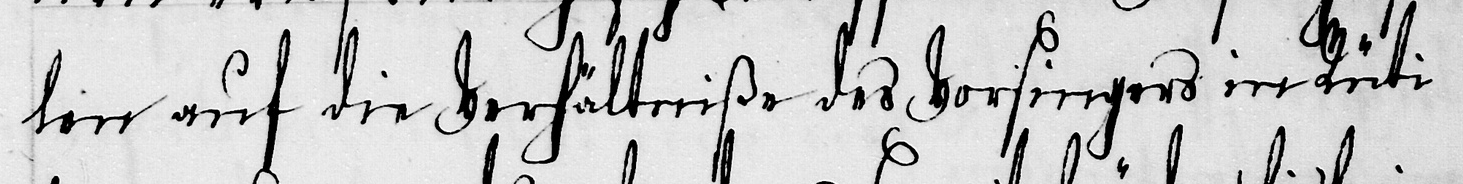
len auf die Verhältniße des Vorsingers in Rüti
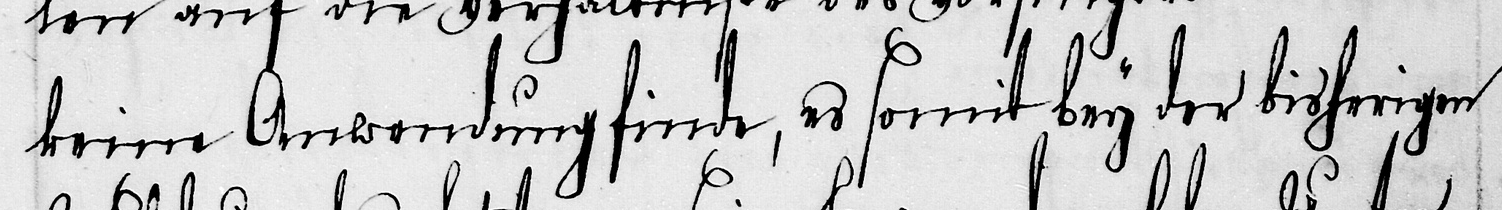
keine Anwendung finde, es somit bey der bisherigen
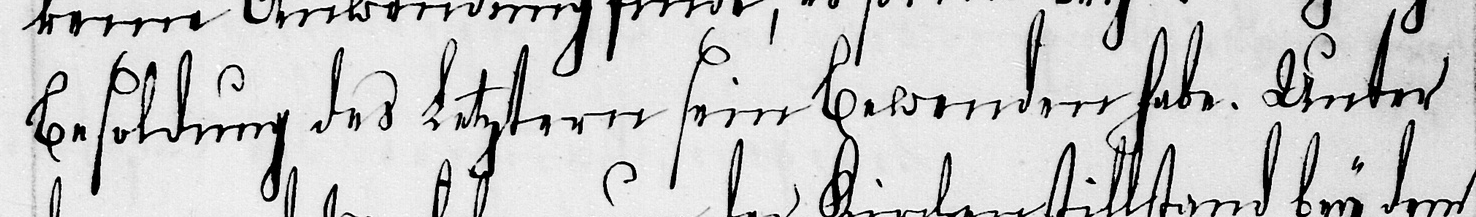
Besoldung des Letztern sein Bewenden habe. Unter
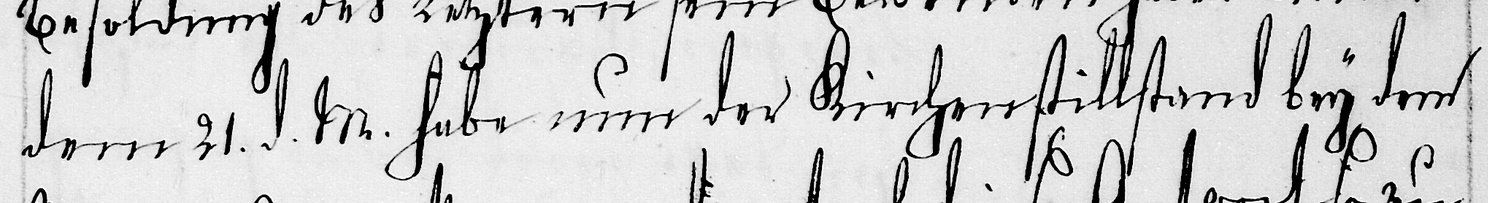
dem 21. d. M. habe nun der Kirchenstillstand bey dem
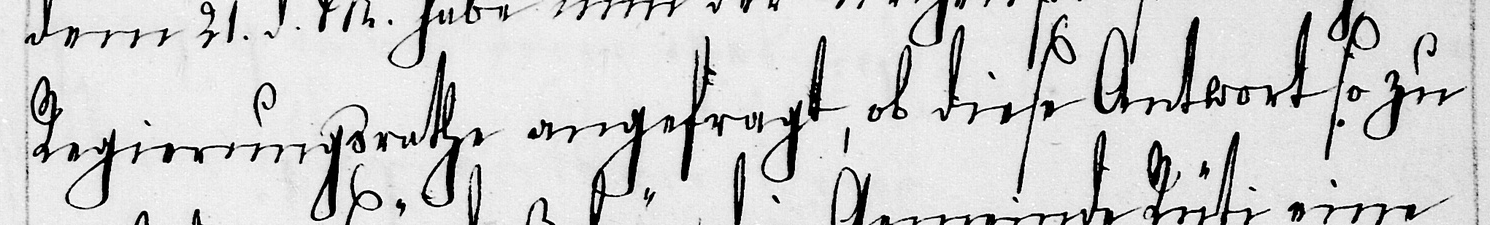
Regierungsrathe angefragt, ob diese Antwort so zu
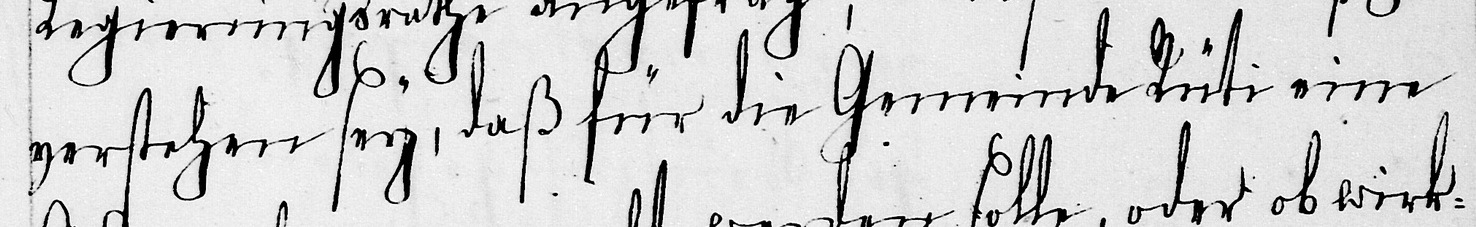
verstehen sey, daß für die Gemeinde Rüti eine
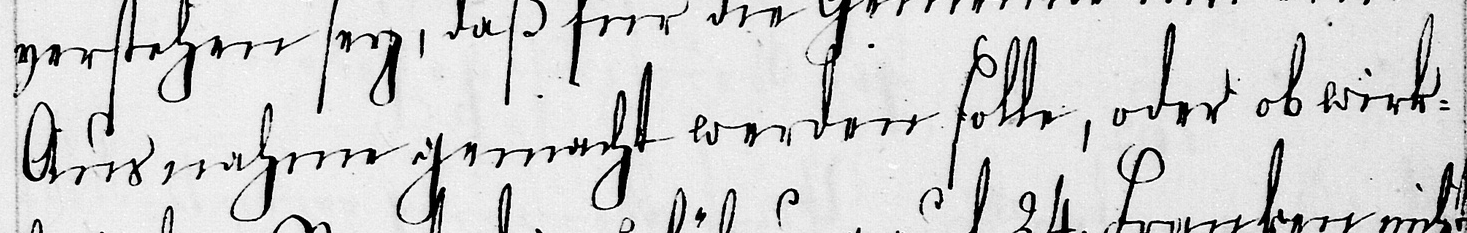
Ausnahme gemacht werden solle, oder ob wirk¬
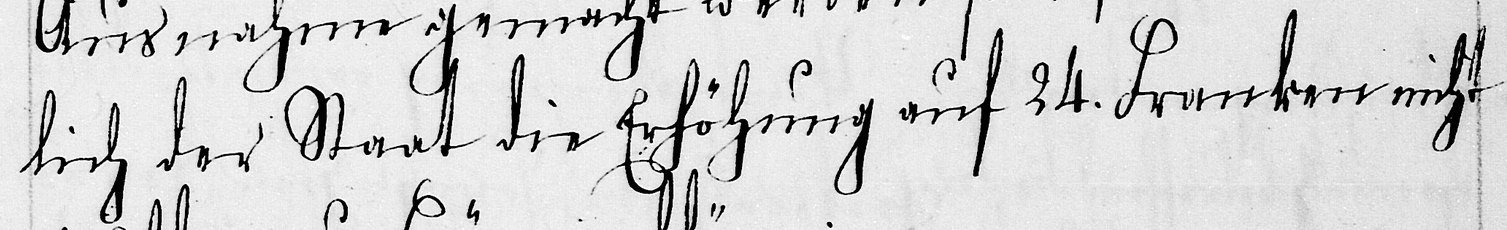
lich der Staat die Erhöhung auf 24. Franken nicht
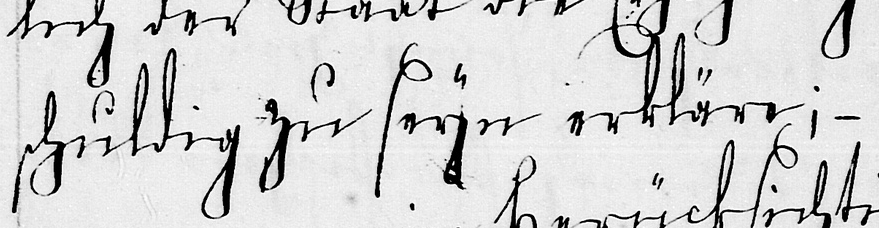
schuldig zu seyn erkläre; –
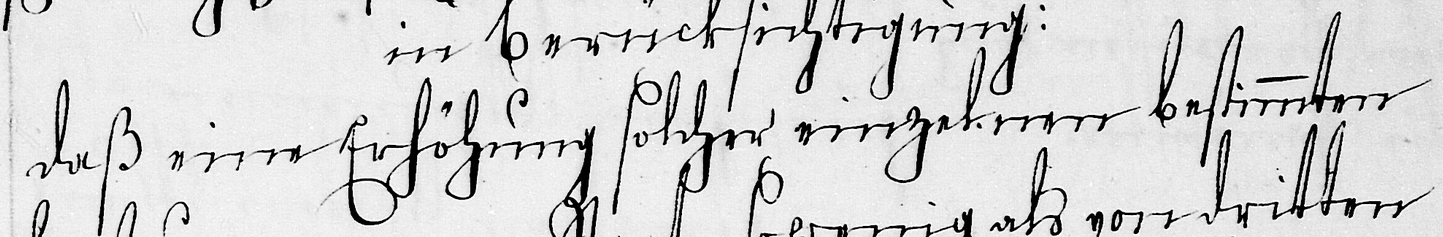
daß eine Erhöhung solcher einzelnen bestimmten
